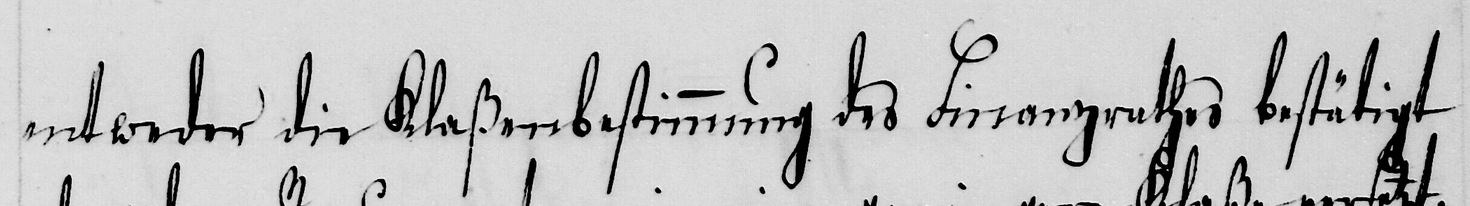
entweder die Klaßenbestimmung des Finanzrathes bestätigt
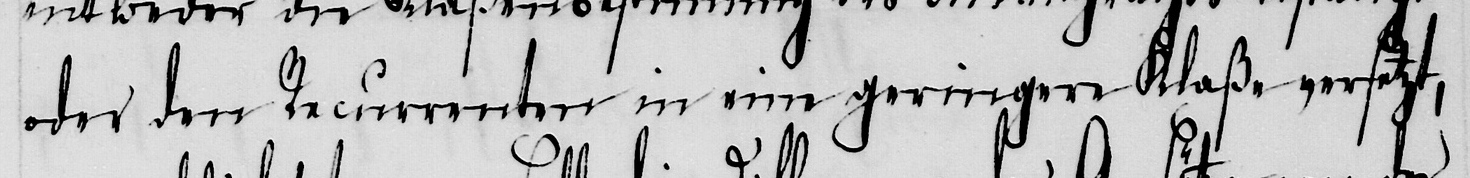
oder den Recurrenten in eine geringere Klaße versetzt,
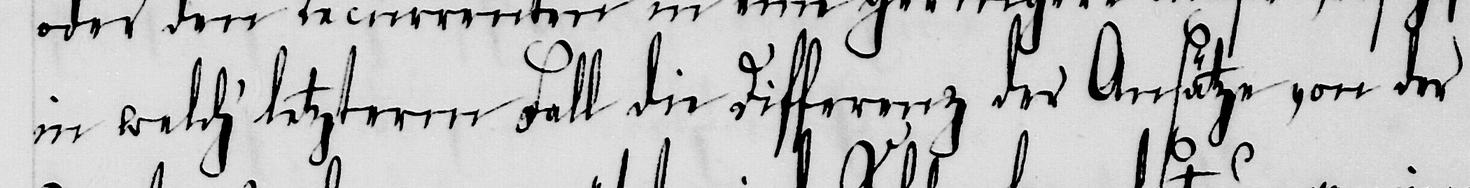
in welch’ letzterem Fall die Differenz der Ansätze von der
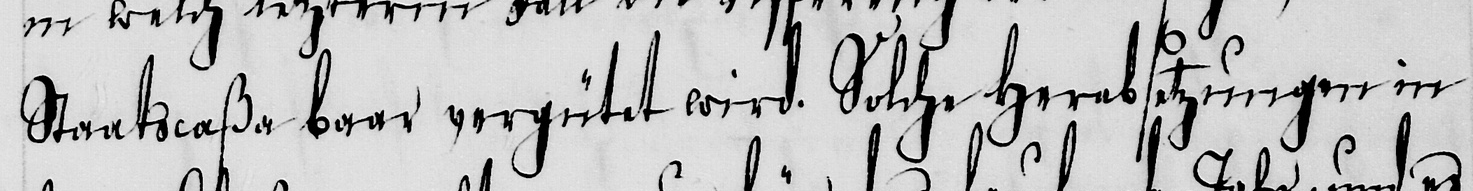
Staatscaßa baar vergütet wird. Solche Herabsetzungen in
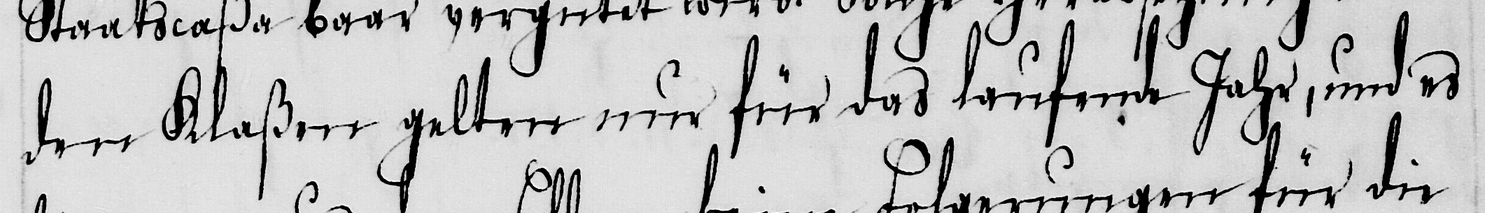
den Klaßen gelten nur für das laufende Jahr, und es
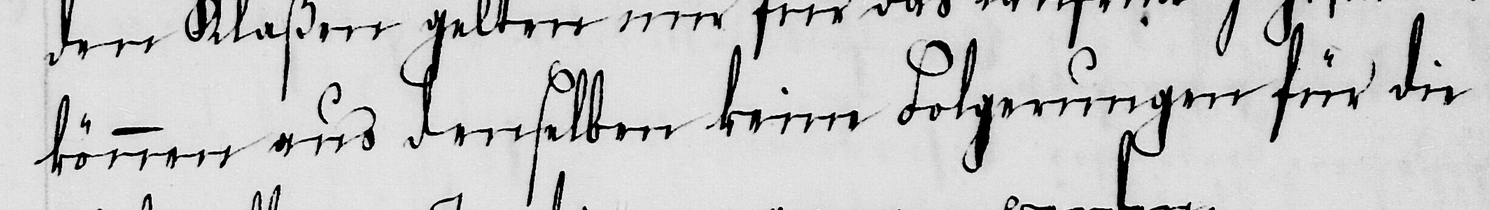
können aus denselben keine Folgerungen für die
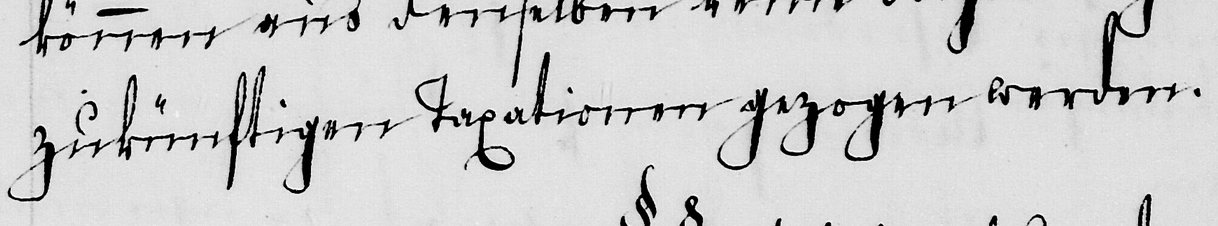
zukünftigen Taxationen gezogen werden.
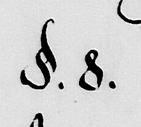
d. M.
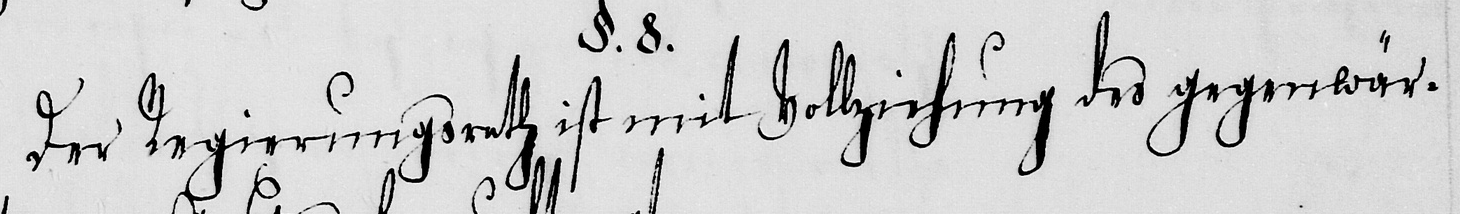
Der Regierungsrath ist mit Vollziehung des gegenwär¬
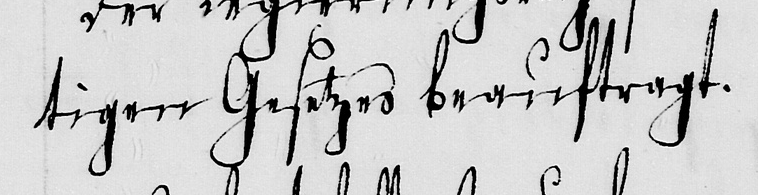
tigen Gesetzes beauftragt.
